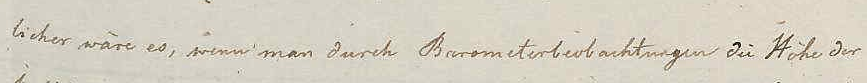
licher wäre es, wenn man durch Barometerbeobachtungen die Höhe der
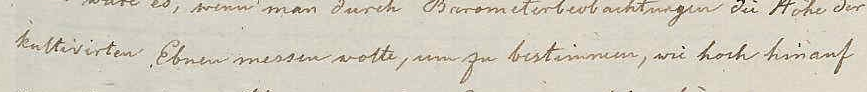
kultivirten Ebnen messen wolte, um zu bestimmen, wie hoch hinauf
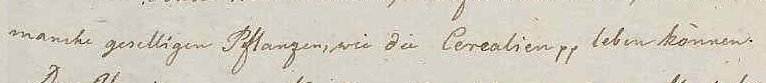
manche geselligen Pflanzen, wie die Cerealien pp leben können.
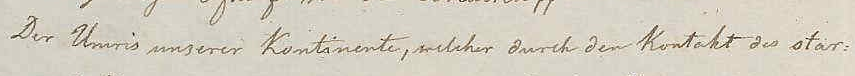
Der Umris unserer Kontinente, welcher durch den Kontakt des star-
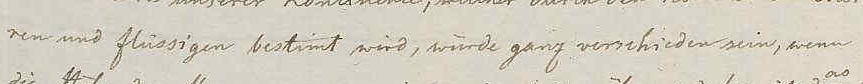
ren und flüssigen bestimt wird, würde ganz verschieden sein, wenn
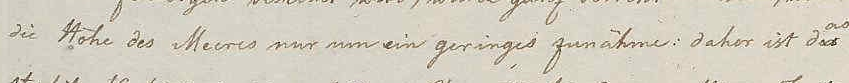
die Höhe des Meeres nur nun ein geringes zunähme: daher ist dieas
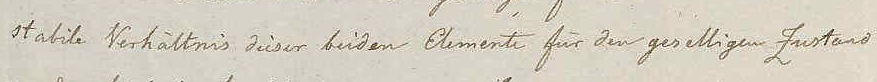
stabile Verhältnis dieser beiden Elemente für den geselligen Zustand
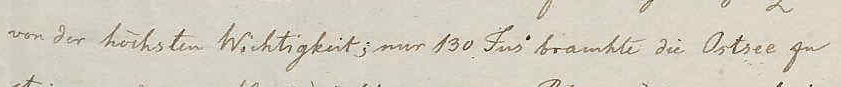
von der höchsten Wichtigkeit; nur 130 Fus brauchte die Ostsee zu
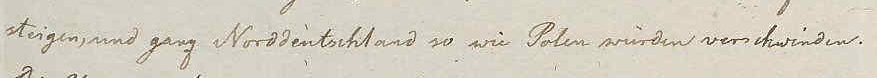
steigen, und ganz Norddeutschland so wie Polen würden verschwinden.
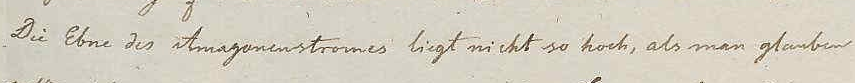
Die Ebne des Amazonenstromes liegt nicht so hoch, als man glauben
